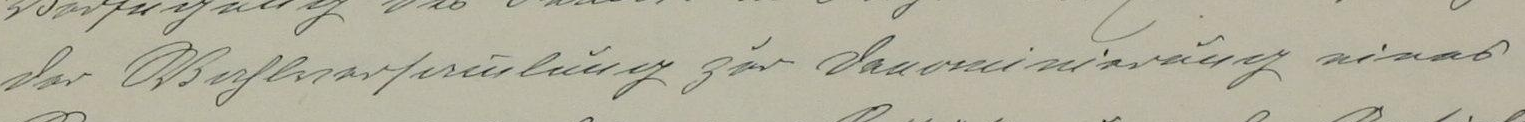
der Wahlversammlung zur Denominierung eines
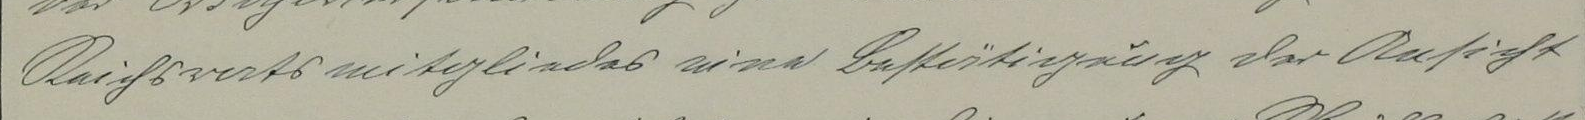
Reichsratsmitgliedes eine Bestätigung der Ansicht
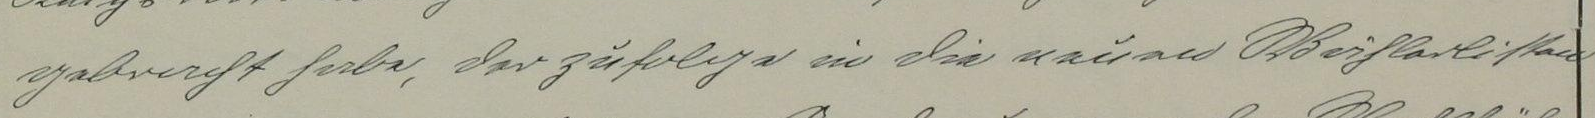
gebracht habe, der zufolge in die neuen Wählerlisten
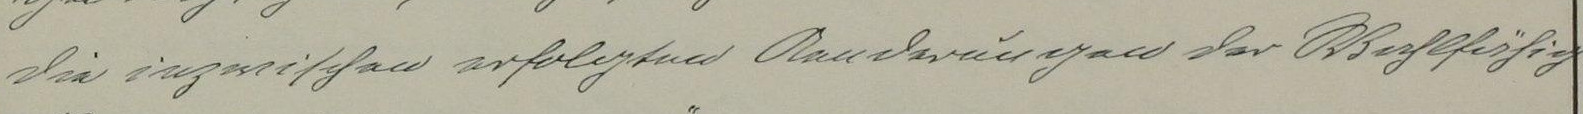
die inzwischen erfolgten Aenderungen der Wahlfähig-
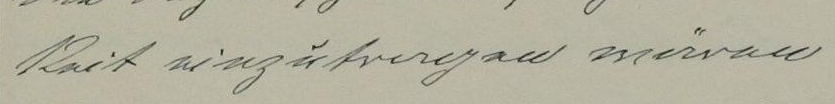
keit einzutragen wären.
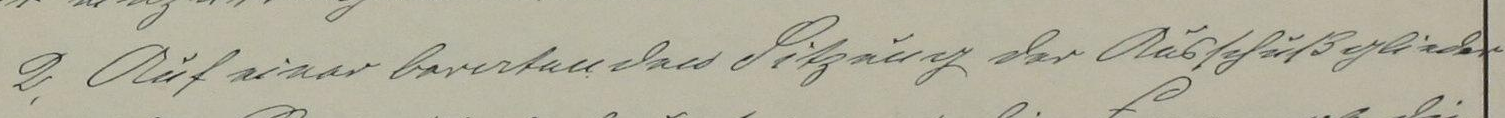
2. Auf einer beratenden Sitzung der Ausschußglieder
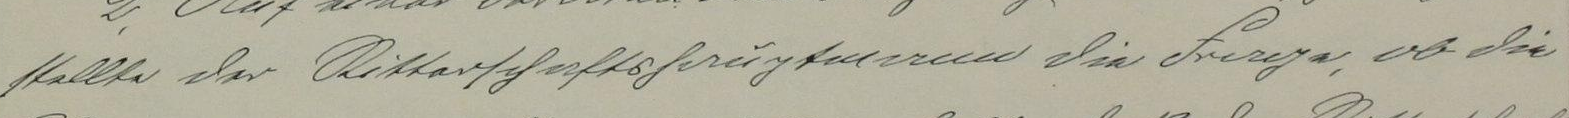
stellte der Ritterschaftshauptmann die Frage, ob die
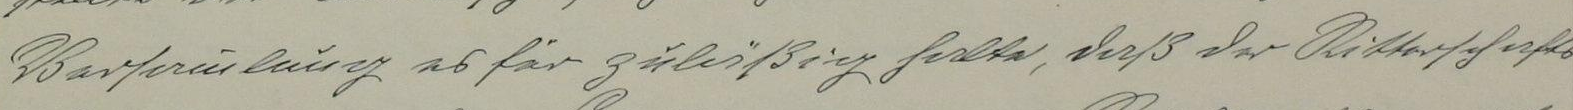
Versammlung es für zuläßig halte, daß der Ritterschafts-
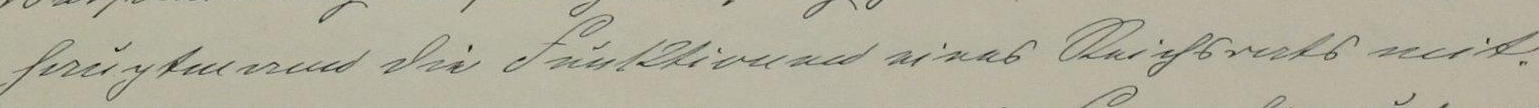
hauptmann die Funktionen eines Reichsratsmit-
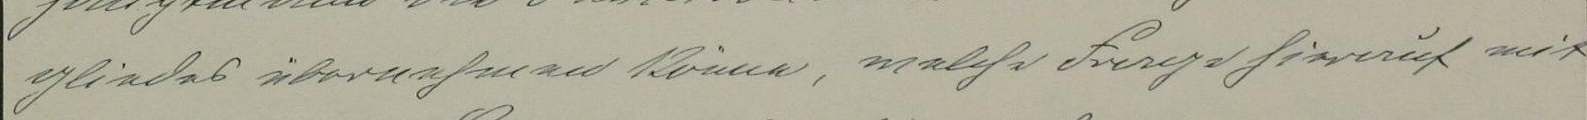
gliedes übernehmen könne, welche Frage hierauf mit
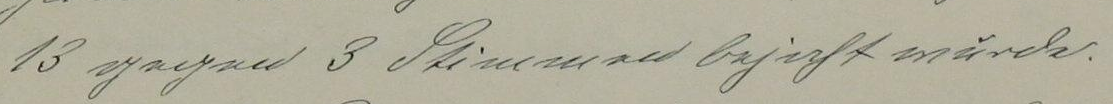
13 gegen 3 Stimmen bejaht wurde.
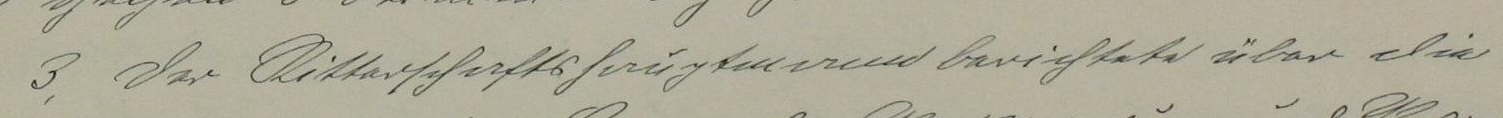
3. Der Ritterschaftshauptmann berichtete über die
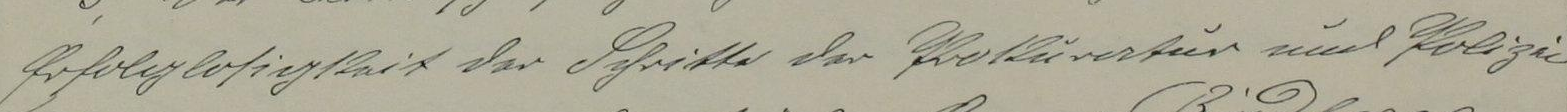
Erfolglosigkeit der Schritte der Prokuratur und Polizei
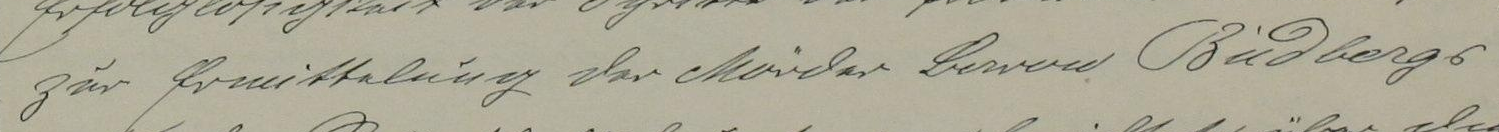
zur Ermittelung der Mörder Baron Budbergs.
